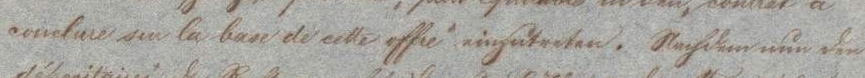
conclure sur la base de cette offre» einzutreten. Nachdem nun den
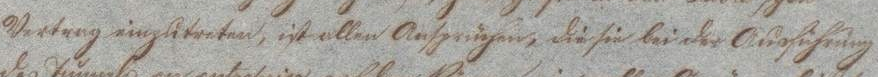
Vertrag einzutreten, ist allen Ansprüchen, die sie bei der Ausführung
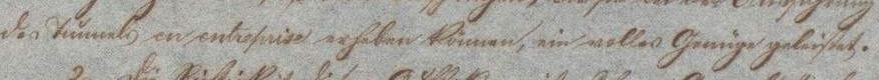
des Tunnels en entreprise erheben können, ein volles Genüge geleistet.
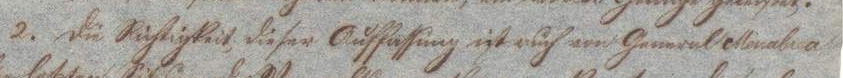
2. Die Richtigkeit dieser Auffassung ist auch von General Menabrea
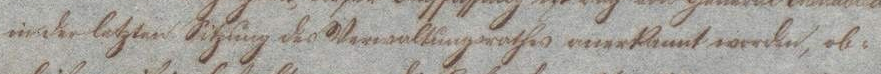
in der letzten Sitzung des Verwaltungsrathes anerkannt worden, ob-
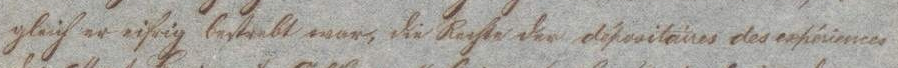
gleich er eifrig bestrebt war, die Rechte der dépositaires des expériences
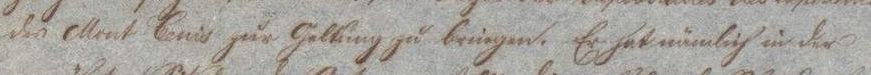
des Mont Cenis zur Geltung zu bringen. Er hat nämlich in der
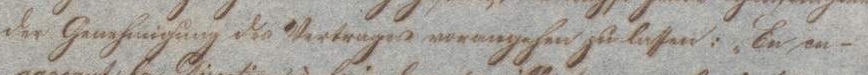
der Genehmigung des Vertrages vorangehen zu lassen: «En en-
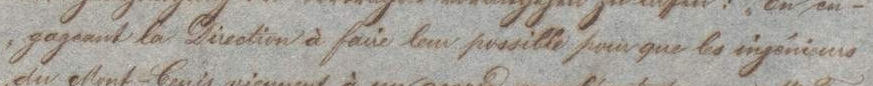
gageant la Direction à faire leur possible pour que les ingénieurs
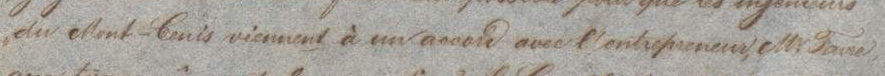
du Mont-Cenis viennent à un accord avec l'entrepreneur, Mr. Favre,
